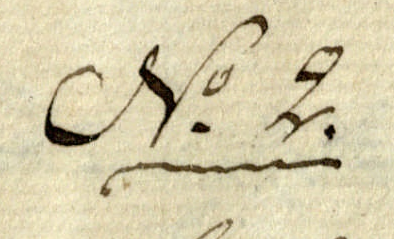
No 2.
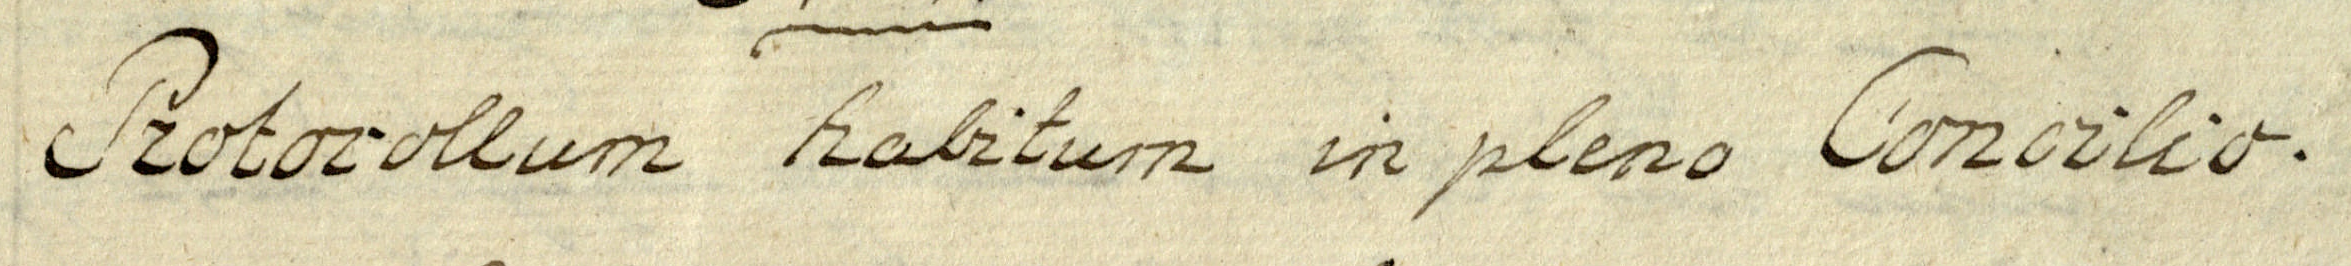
Protocollum habitum in pleno Concilio.
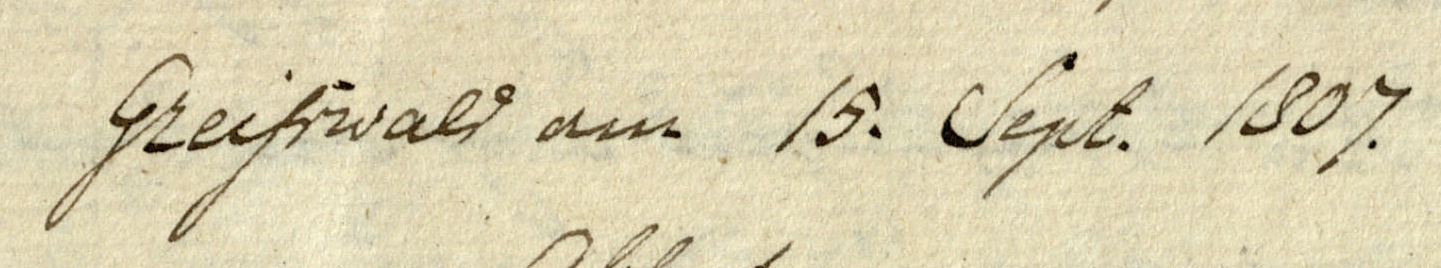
Greifswald am 15. Sept. 1807.
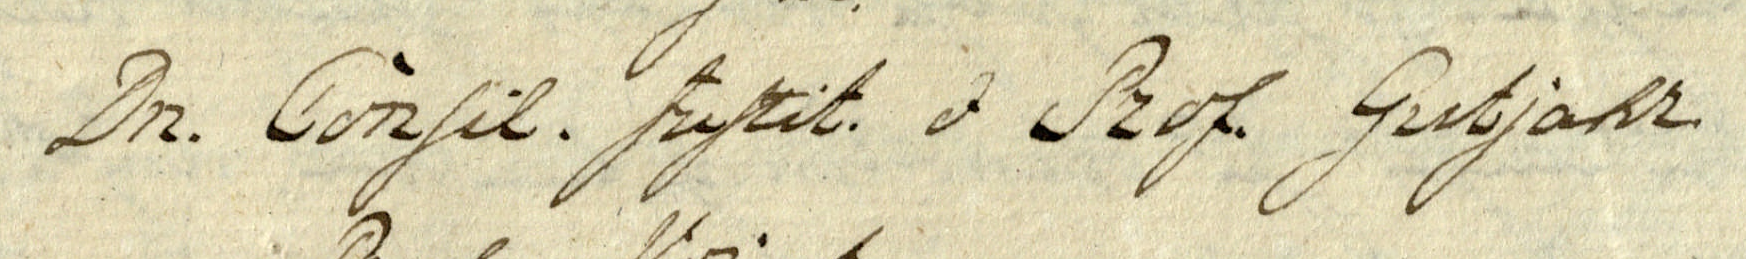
Dn. Consil. Justit. et Prof. Gutjahr.
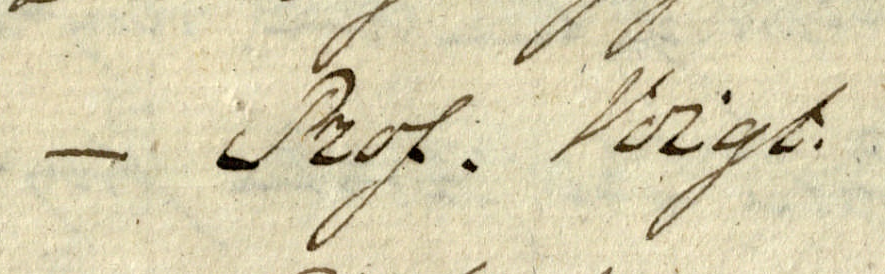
Prof. Voigt.
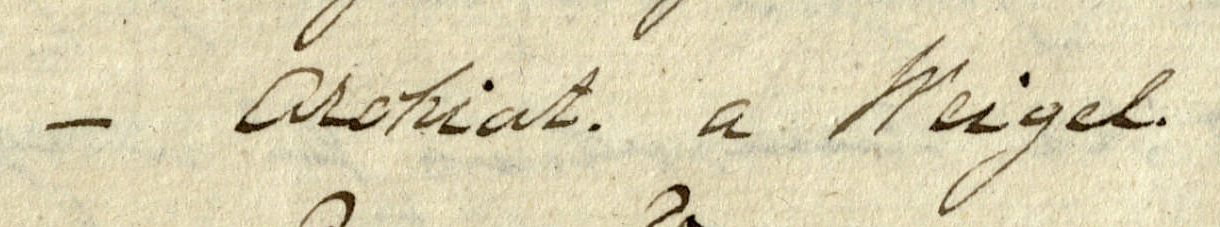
Archiat. a Weigel.
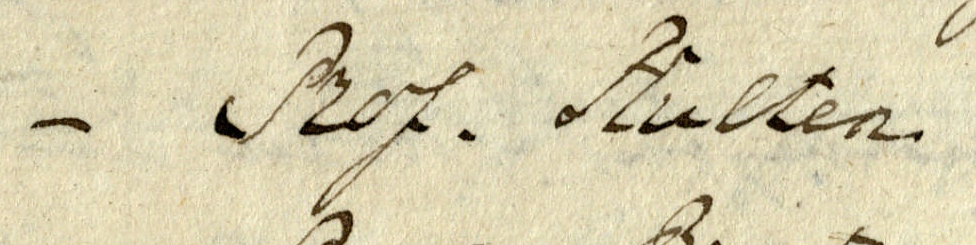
Prof. Hultén.
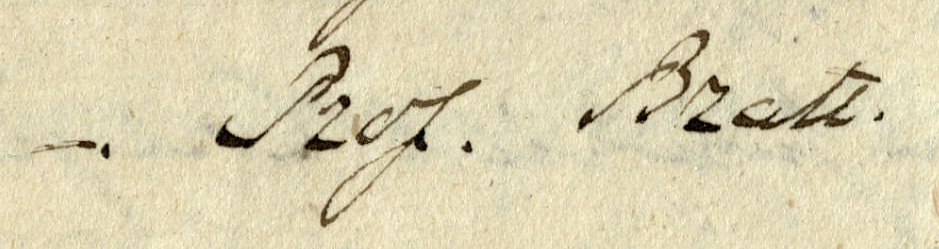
Prof. Bratt.
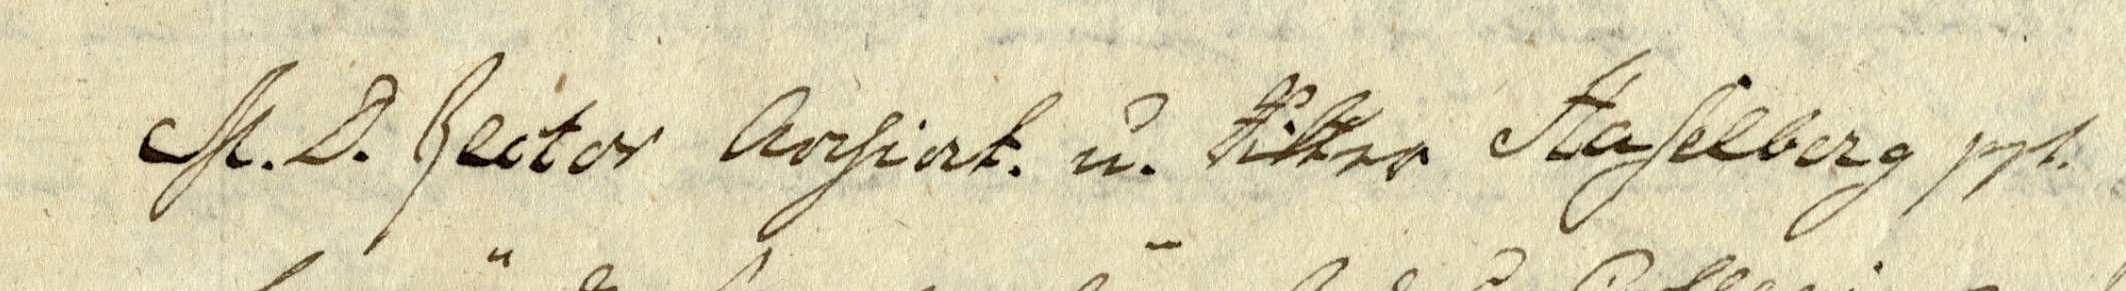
M D. Rector Archiat. u. Ritter Haselberg ppt.
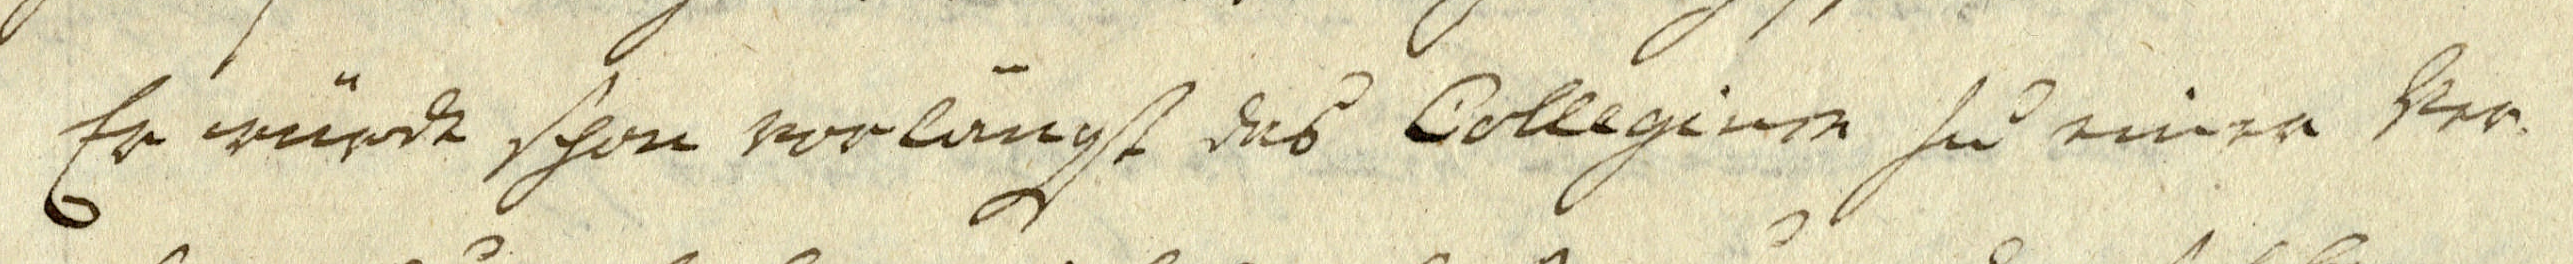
Er würde schon vorlängst das Collegium zu einer Ver¬
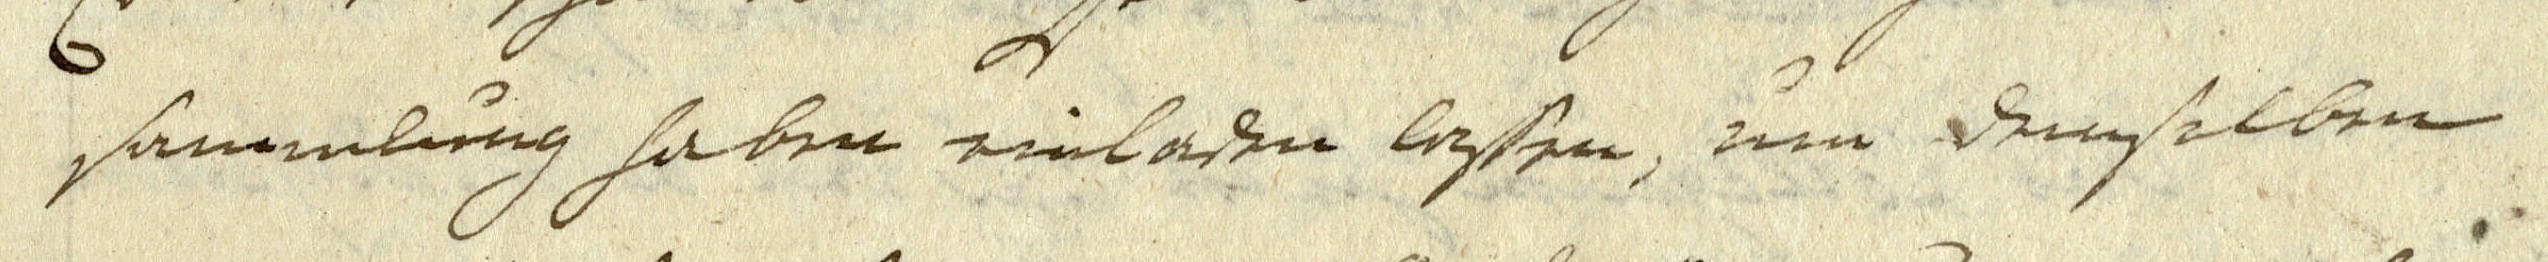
sammlung haben einladen lassen, um demselben
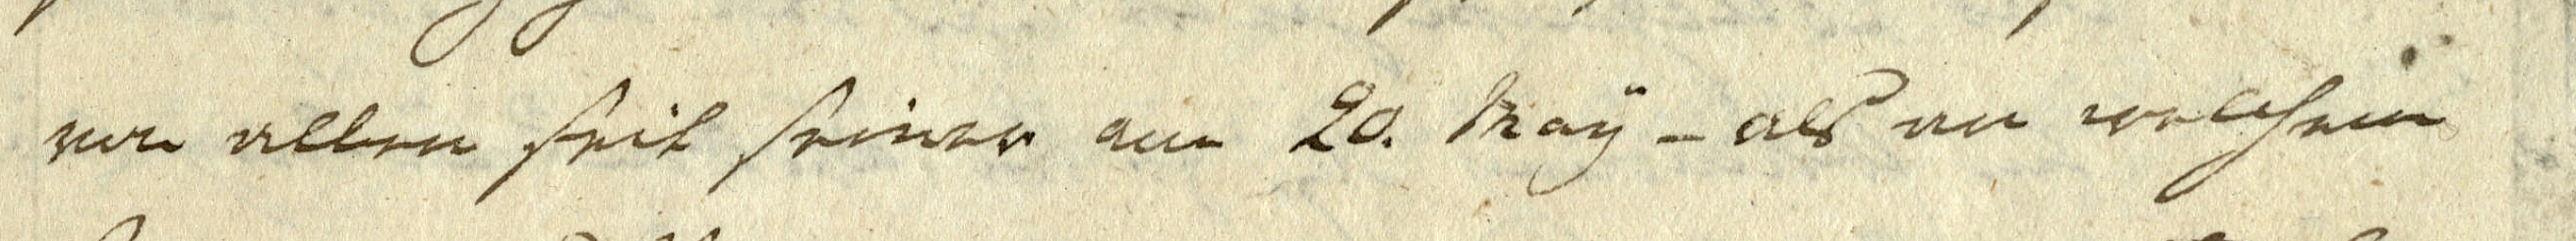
von allen seit seiner am 20. Maÿ - als an welchem
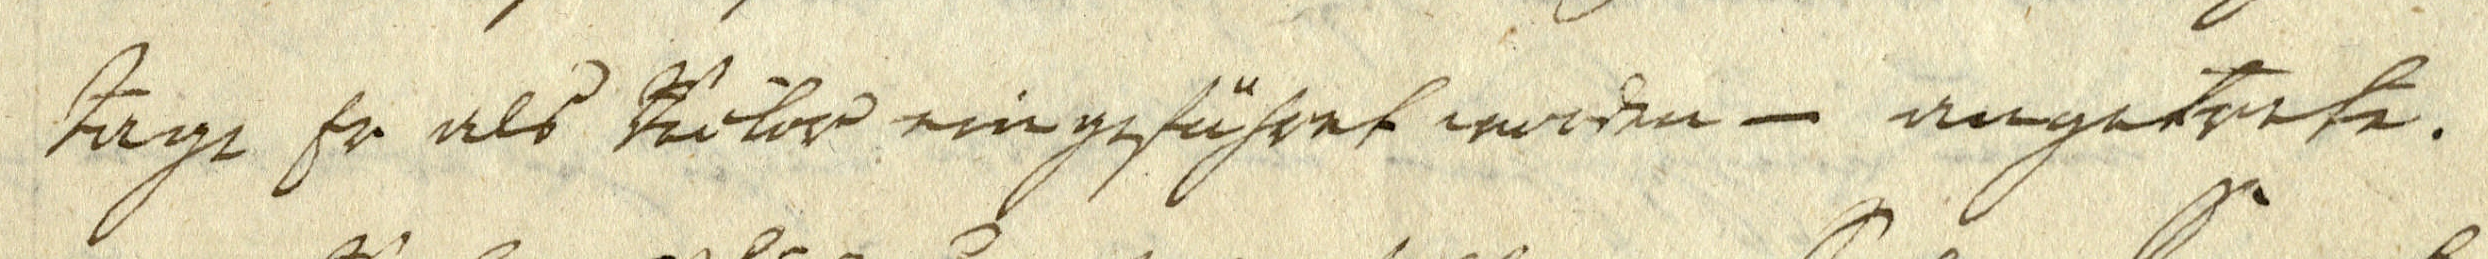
Tage Er als Rector eingeführet worden - angetrete¬
